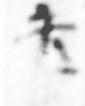夫
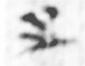之
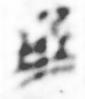爲
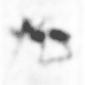○（左）
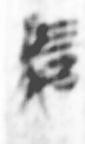驂
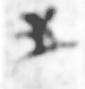之
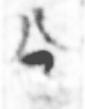公
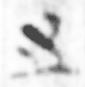之
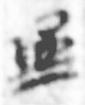爲
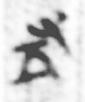○（右）
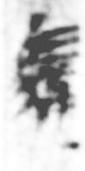○（服）
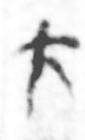大
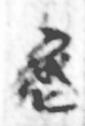○（路）
